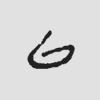㠯（以）
